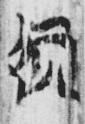凥（處）
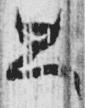也
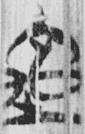○（禹）
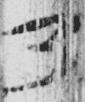乃
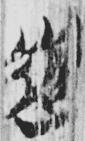從
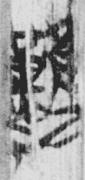灘（漢）
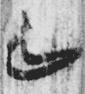㠯（以）
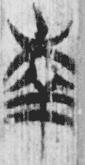南
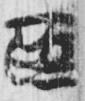爲
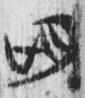名
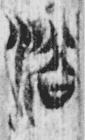浴（谷）
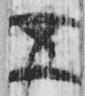五
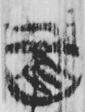百
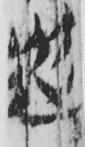從
